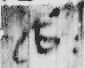左
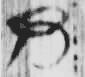尹
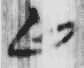㠯（以）
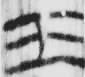王
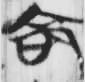命
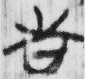告
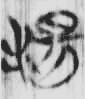湯
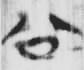公
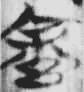舒
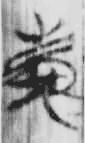慶
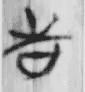告
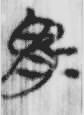{胃刀}（謂）
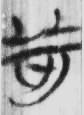苛
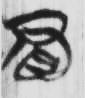冒
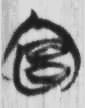○（宣）
